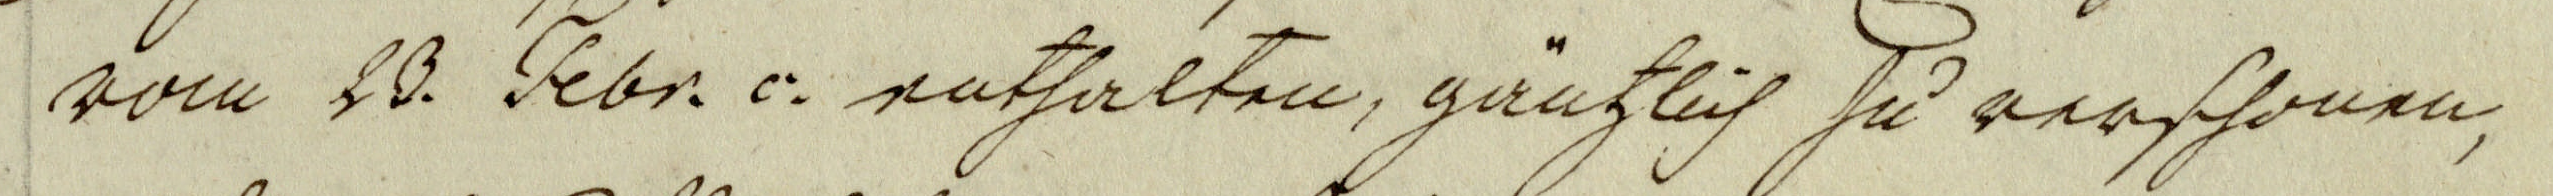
vom 23. Febr. c. enthalten, gäntzlich zu verschonen,
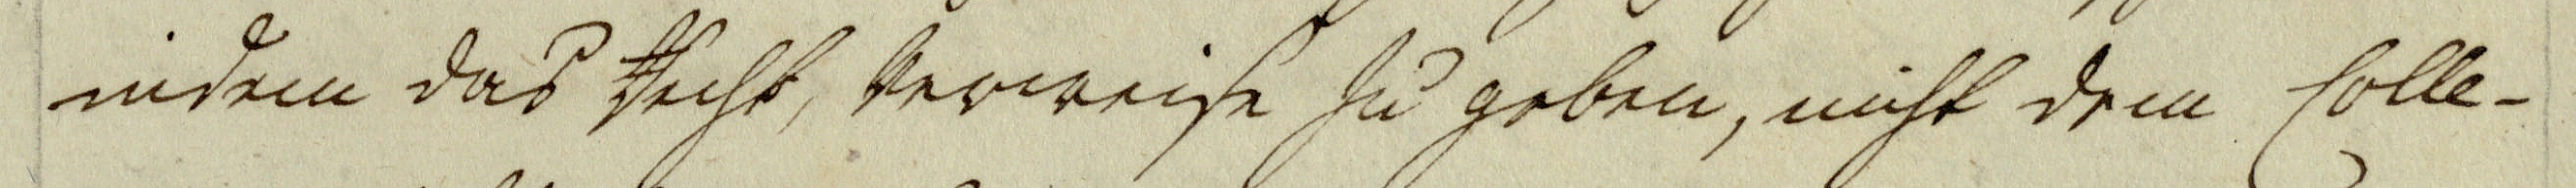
indem das Recht, Verweise zu geben, nicht dem Colle¬
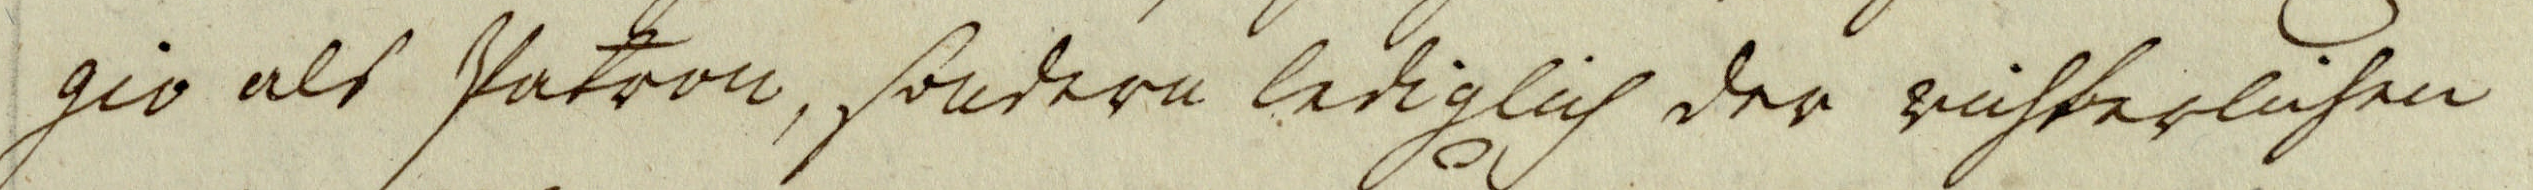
gio als Patron, sondern lediglich der richterlichen
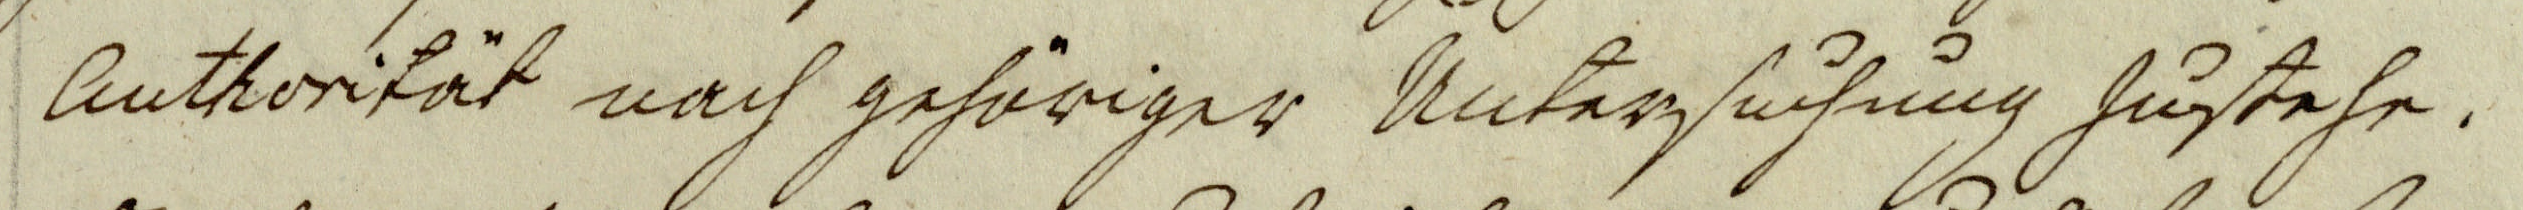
Authorität nach gehöriger Untersuchung zustehe,
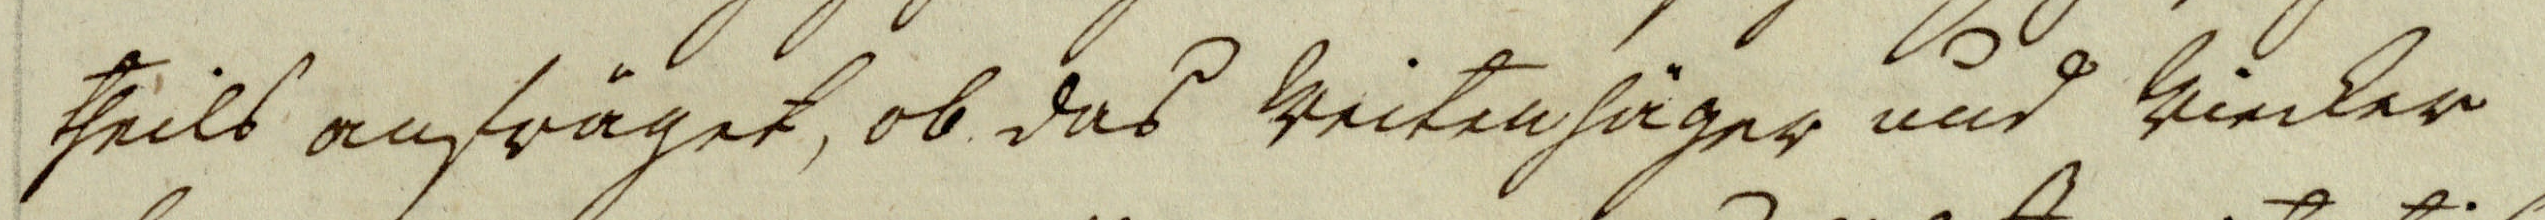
theils anfräget, ob das Weitenhäger und Wiecker
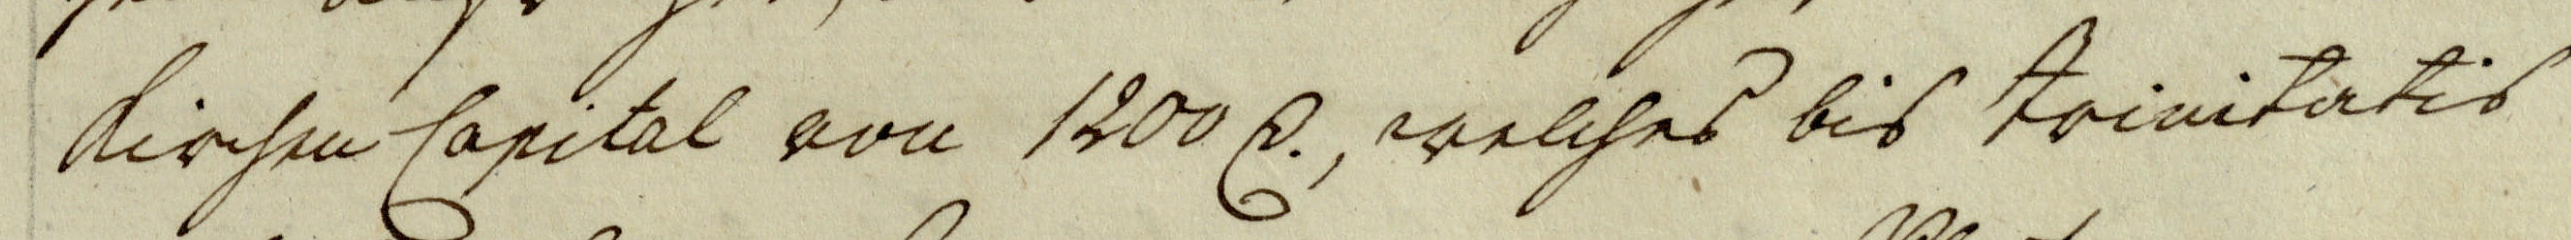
Kirchen Capital von 1200 rtl., welches bis Trinitatis
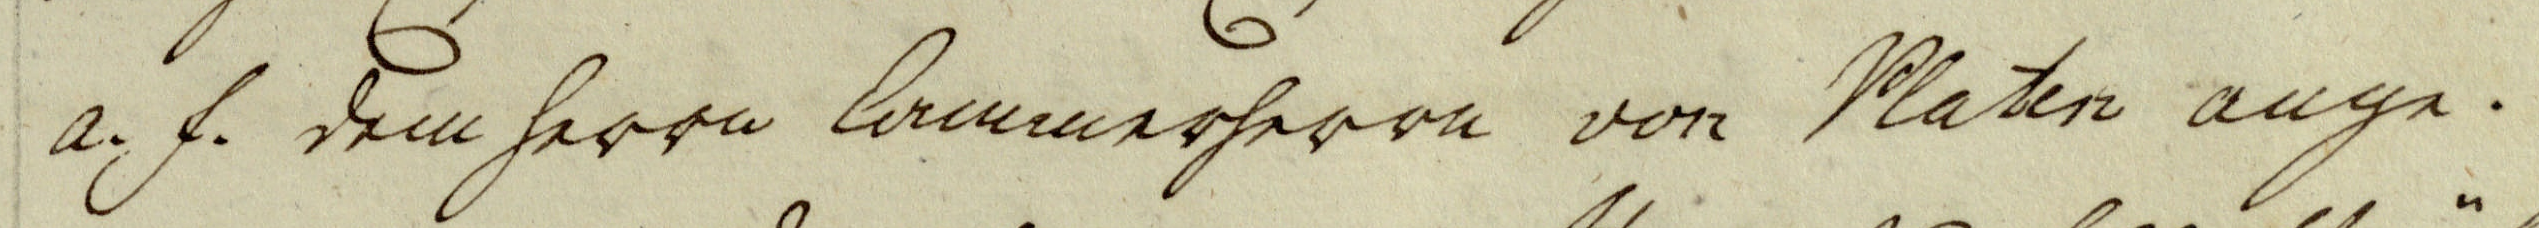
a. f. dem Herrn Cammerherrn von Platen ange¬
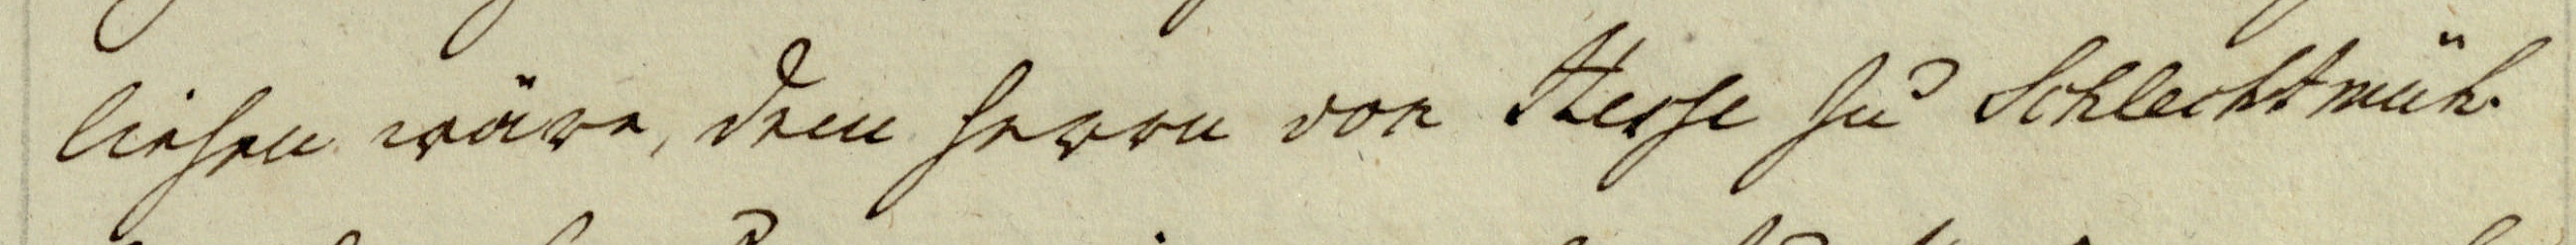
liehen wäre, dem Herrn von Heche zu Schlechtmüh¬
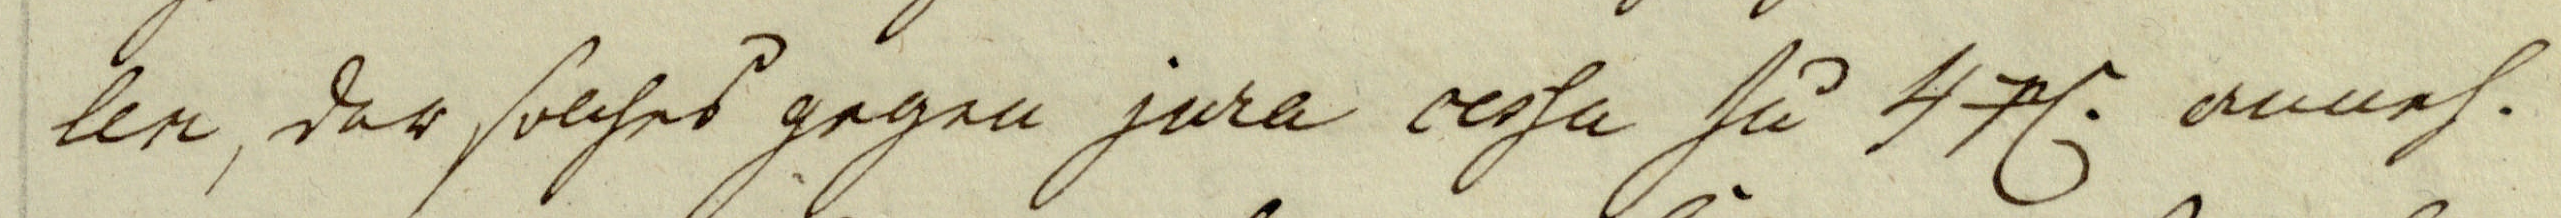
len, der solches gegen jura cessa zu 4 Pf. anneh¬
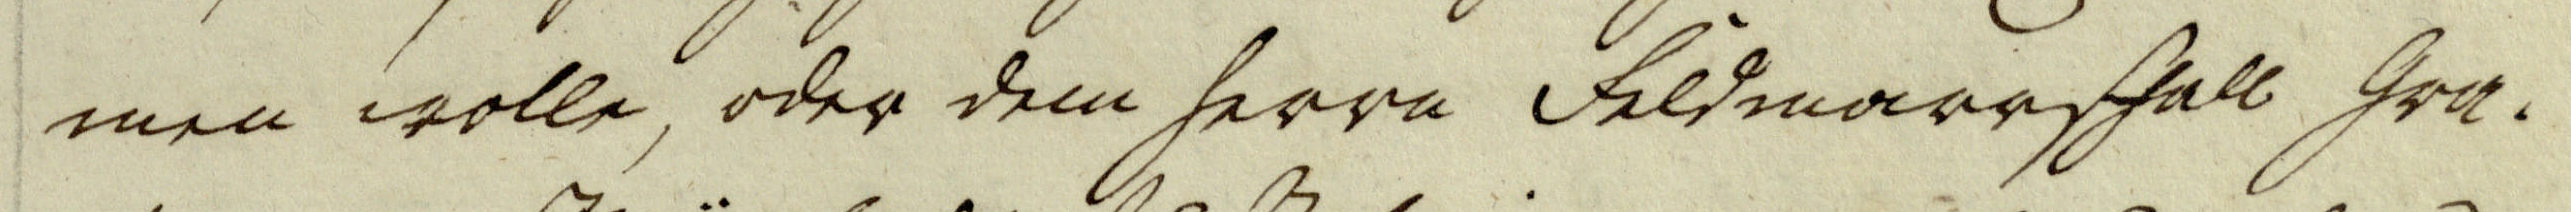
men wolle, oder dem Herrn Feldmarrschall Gra¬
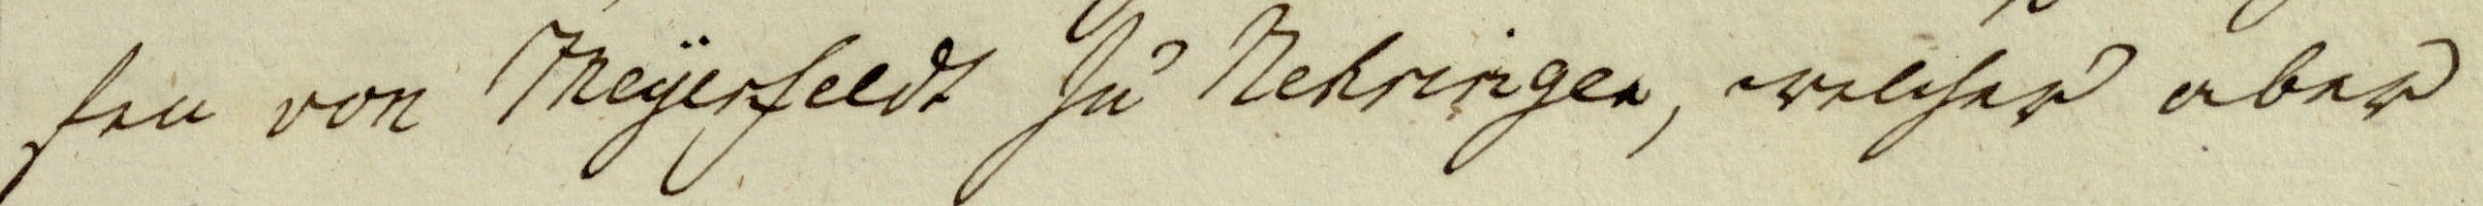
fen von Meÿerfeldt zu Nehringen, welcher aber
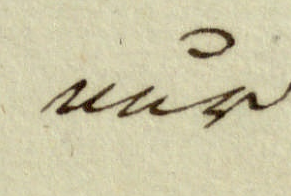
nur
